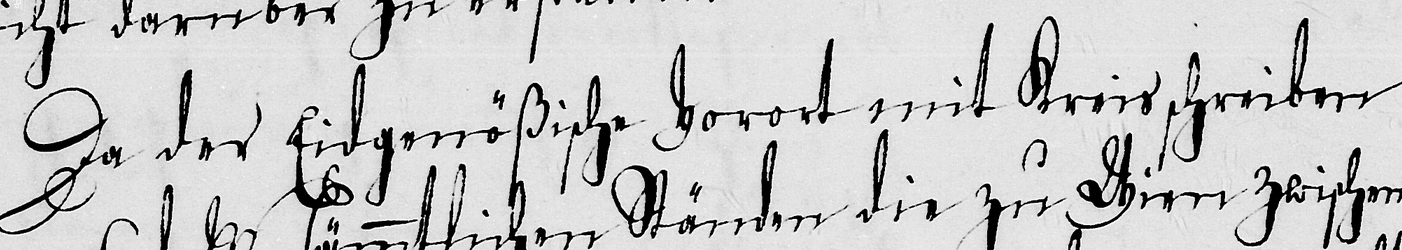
Da der Eidgenößische Vorort mit Kreisschreiben
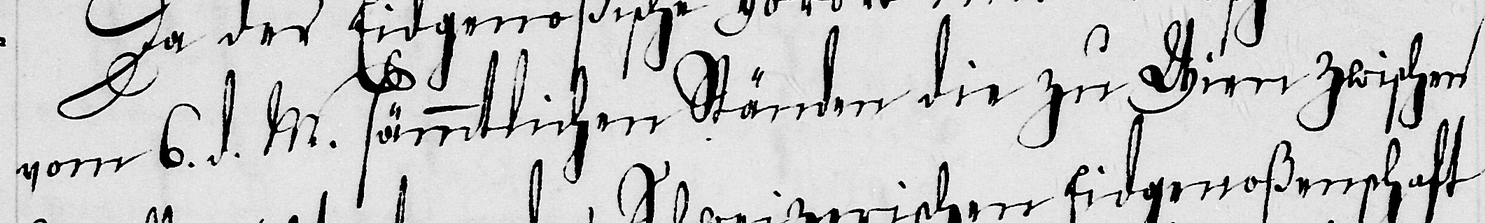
vom 6. d. M. sämmtlichen Ständen die zu Wien zwischen
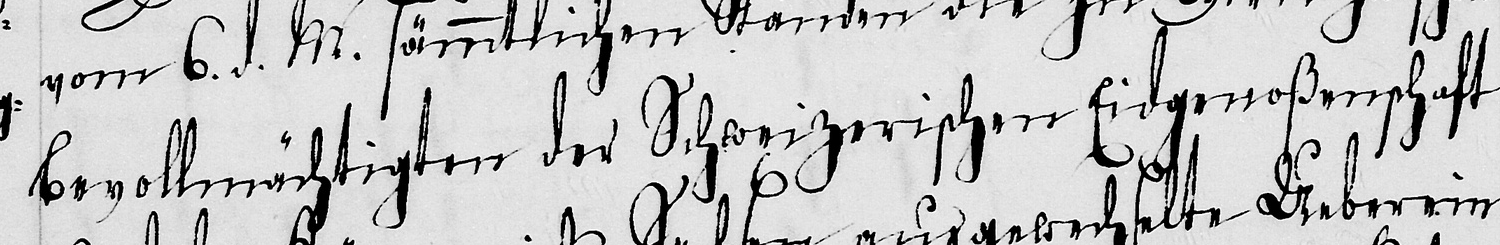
Bevollmächtigten der Schweizerischen Eidgenoßenschaft
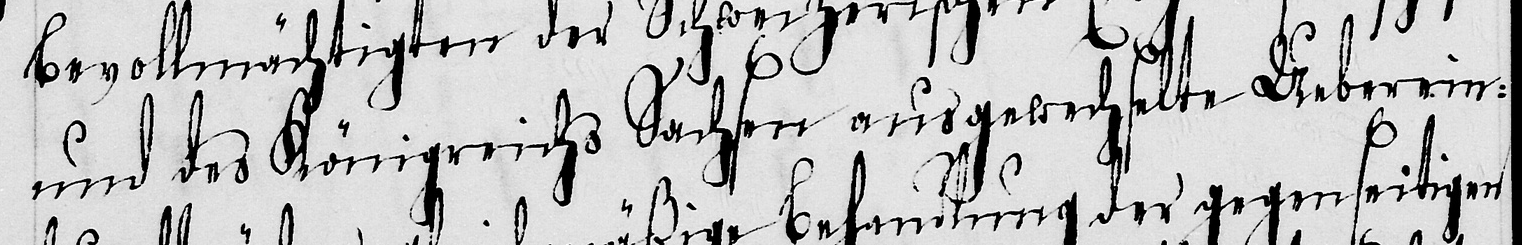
und des Königreichs Sachsen ausgewechselte Ueberein¬
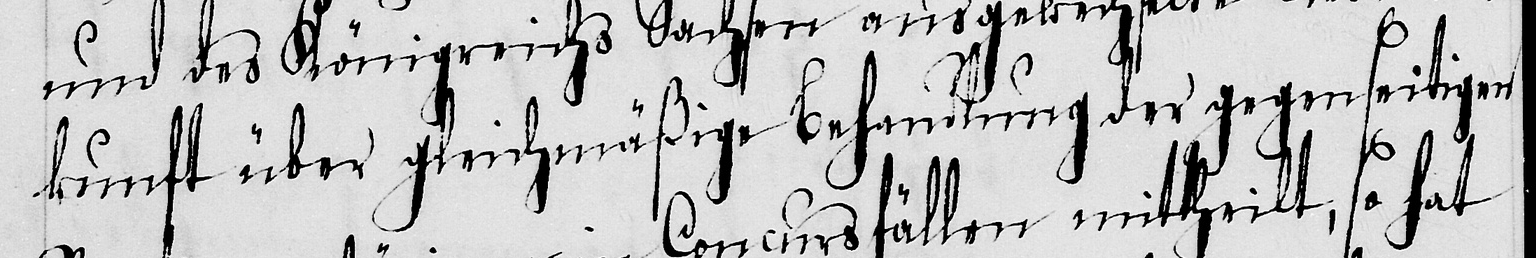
kunft über gleichmäßige Behandlung der gegenseitigen
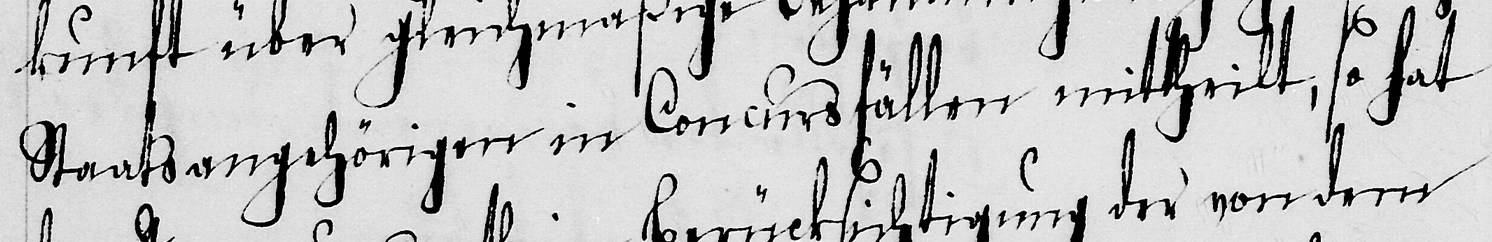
Staatsangehörigen in Concursfällen mittheilt, so hat
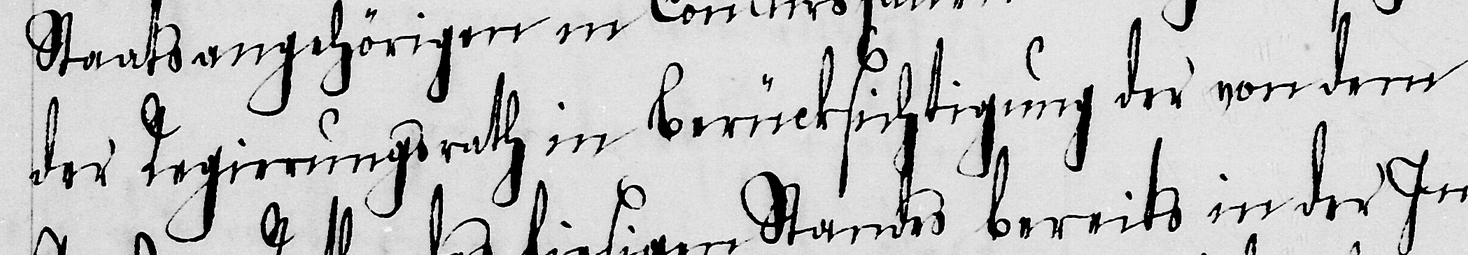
der Regierungsrath in Berücksichtigung der von dem
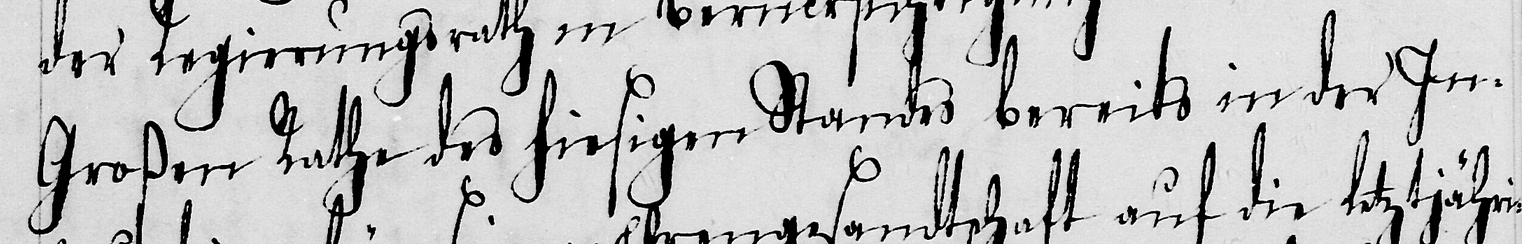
Großen Rathe des hiesigen Standes bereits in der In¬
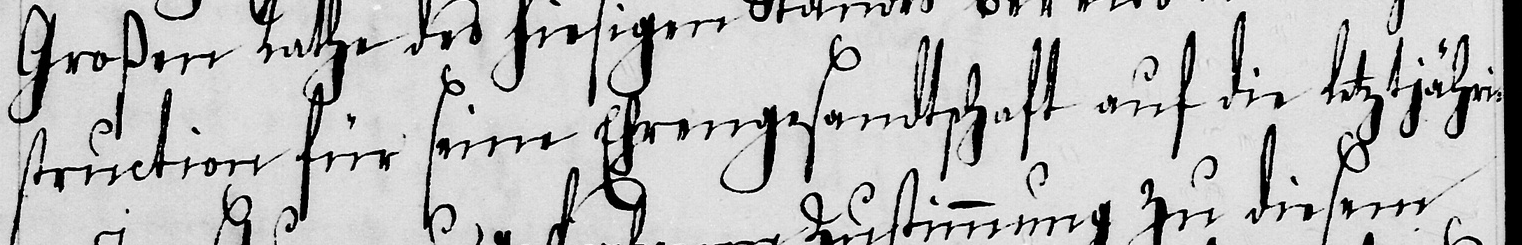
struction für seine Ehrengesandtschaft auf die letztjähr¬
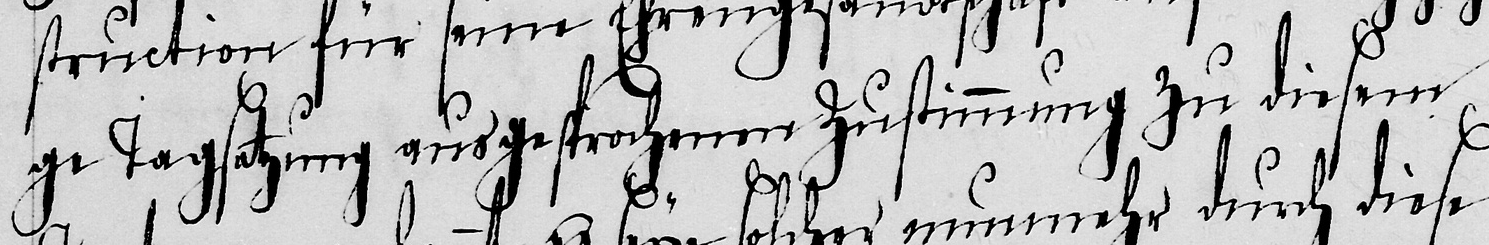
ige Tagsatzung ausgesprochenen Zustimmung zu diesem
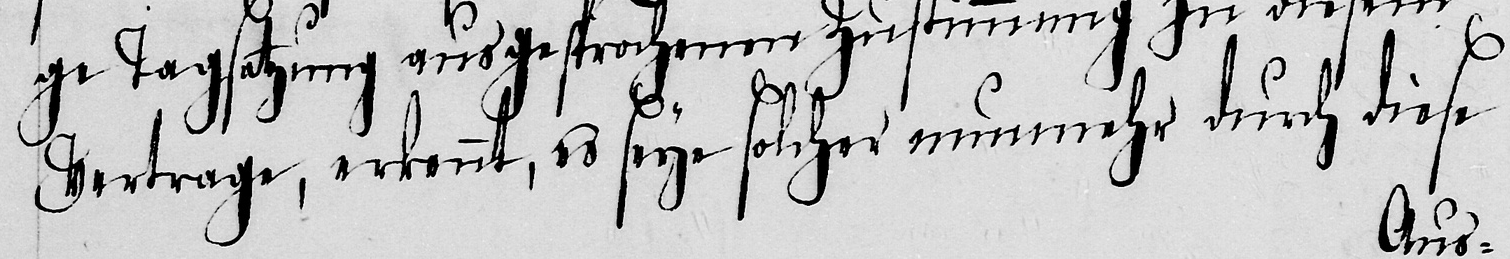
Vertrage, erkannt, es seye solcher nunmehr durch diese
